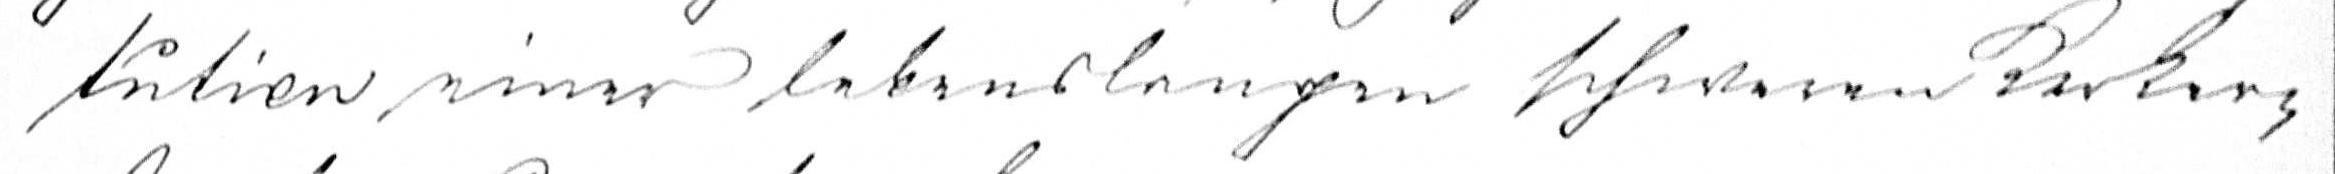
tution einer lebenslangen schweren Kerker¬
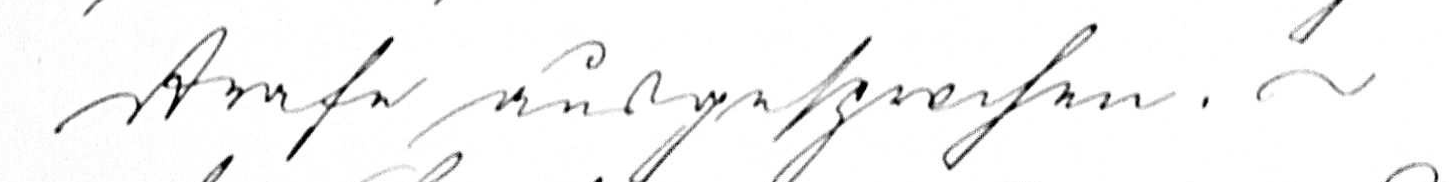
strafe ausgesprochen.
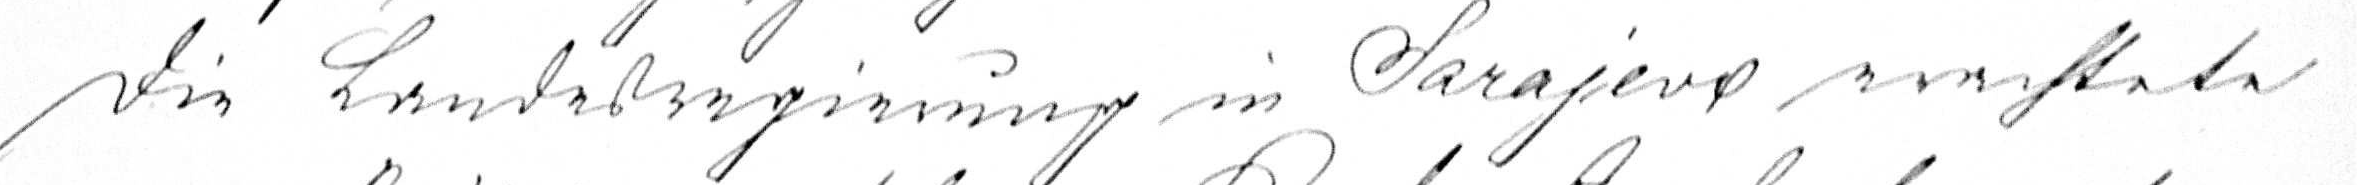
Die Landesregierung in Sarajevo erachtete
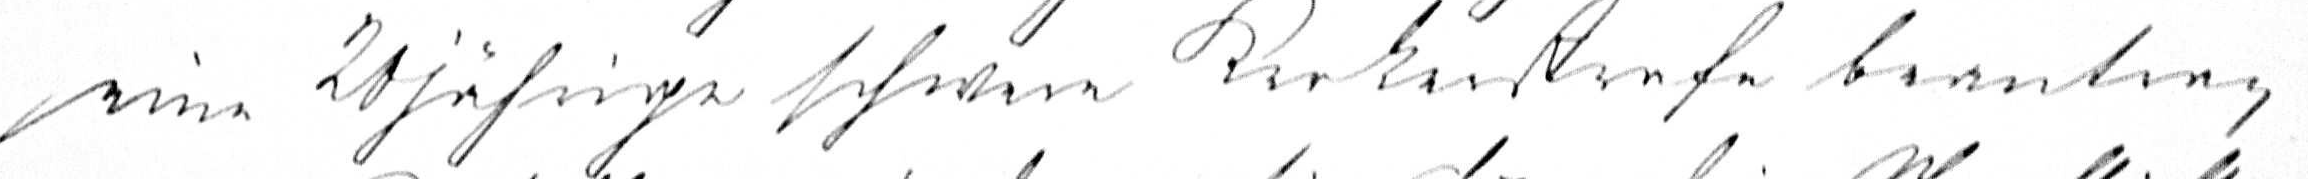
eine 20jährige schwere Kerkerstrafe beantra¬
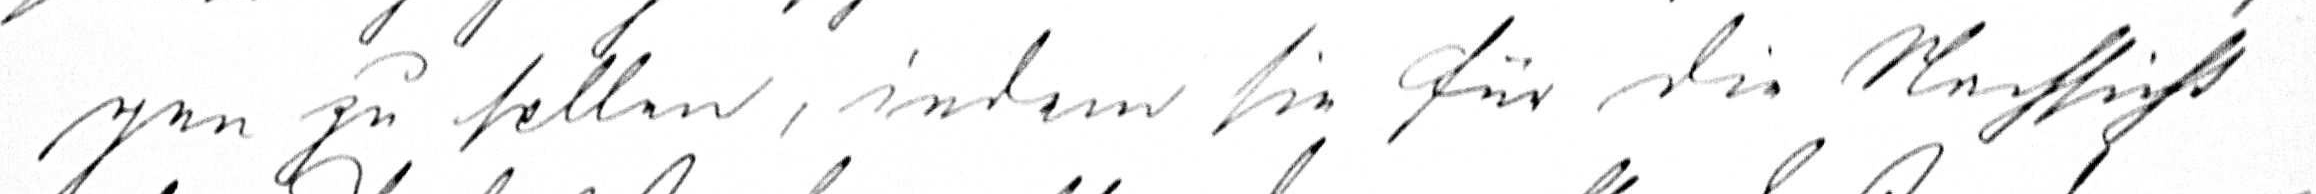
gen zu sollen, indem sie für die Nachsicht
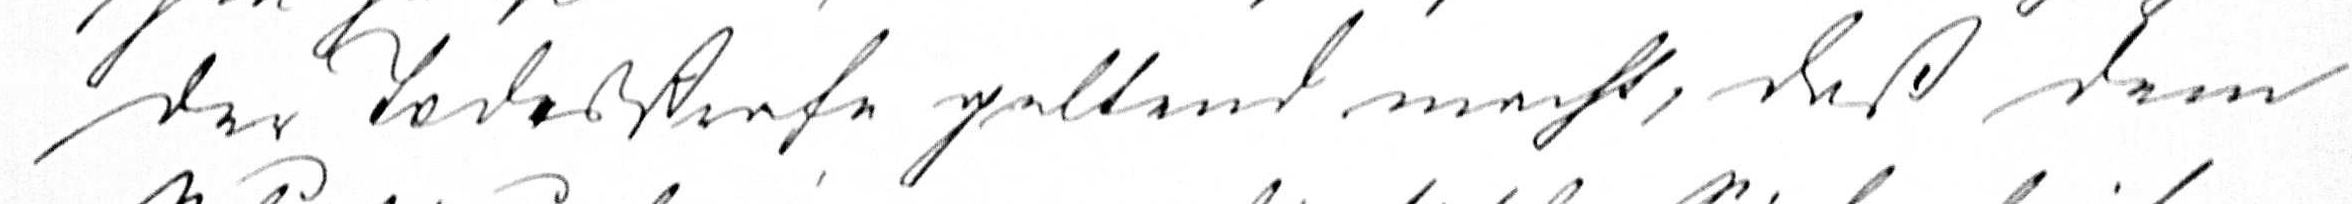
der Todesstrafe geltend macht, daß dem
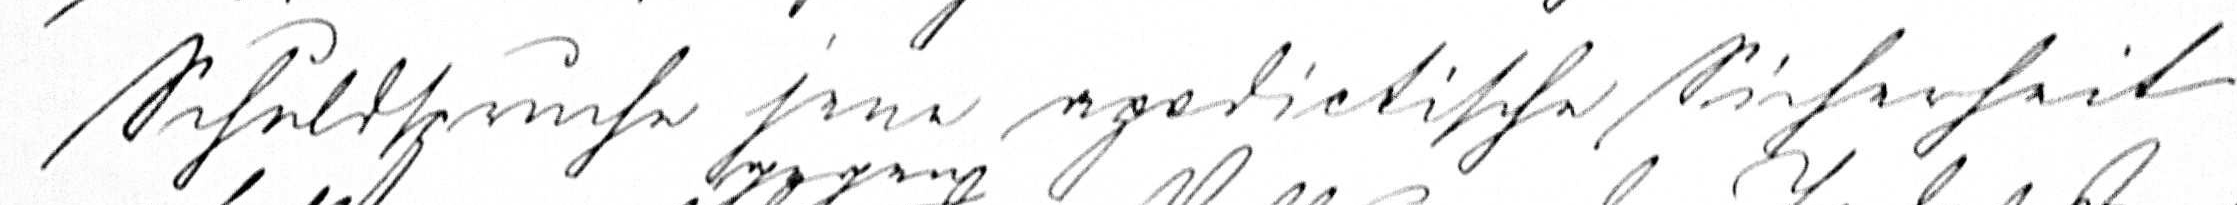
Schuldspruche jene apodictische Sicherheit
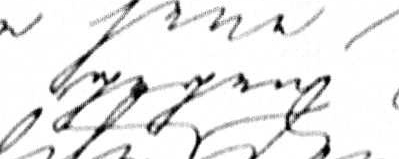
gegen
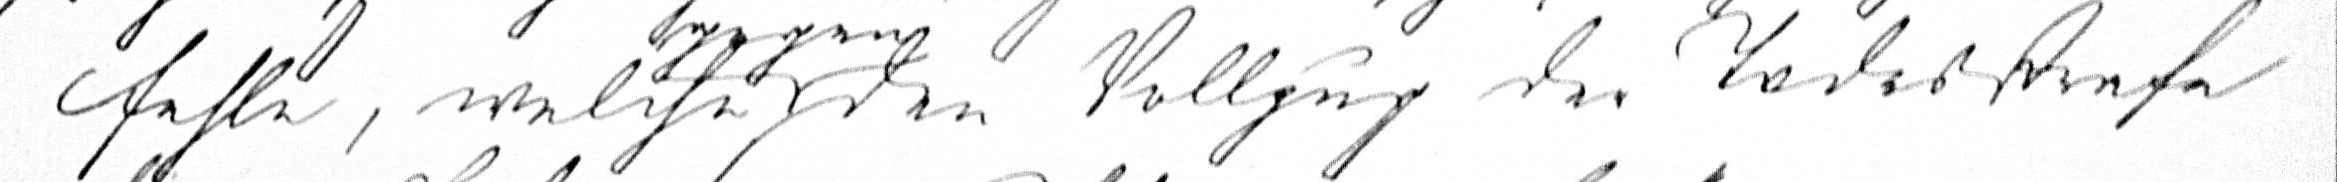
fehle, welche den Vollzug der Todesstrafe
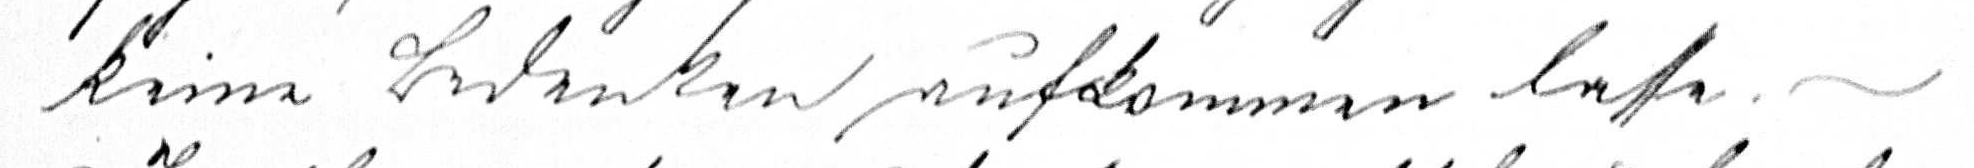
keine Bedenken aufkommen lasse.
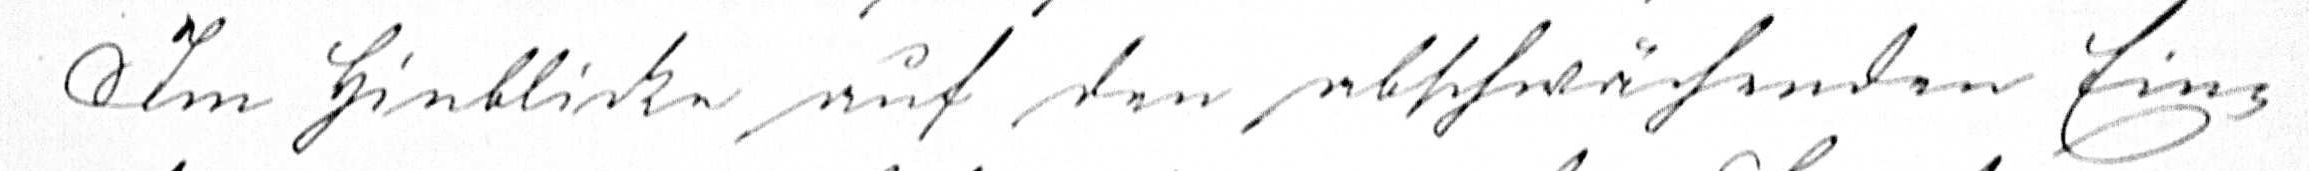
Im Hinblicke auf den abschwächenden Ein¬
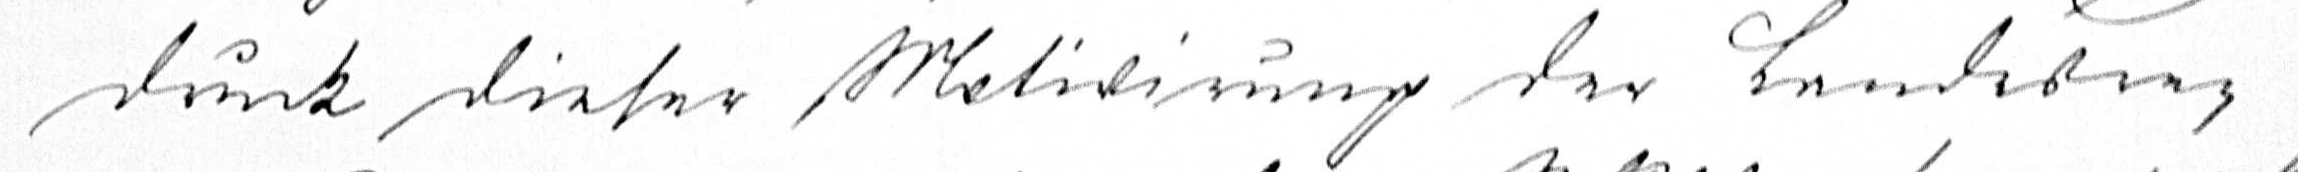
druck dieser Motivirung der Landesre¬
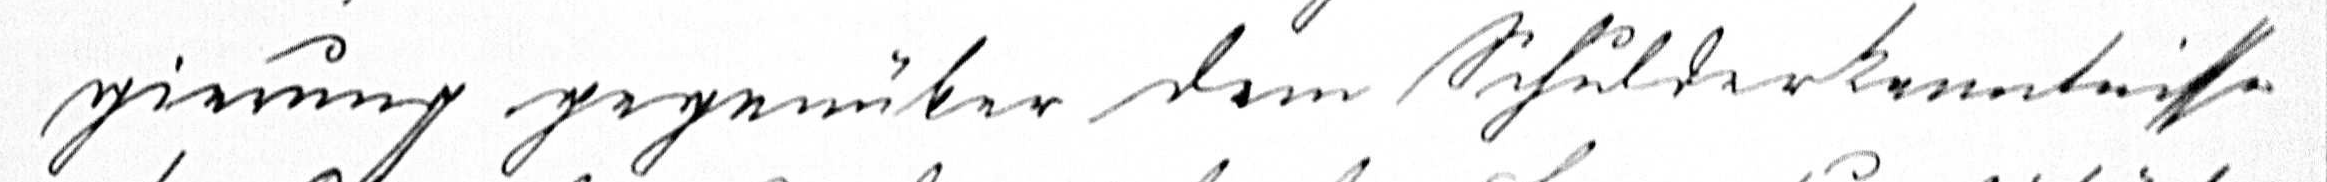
gierung gegenüber dem Schulderkenntnisse
